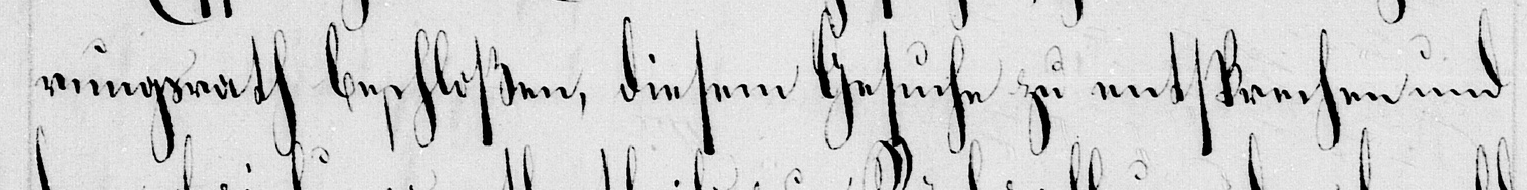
rungsrath beschloßen, diesem Gesuche zu entsprechen und
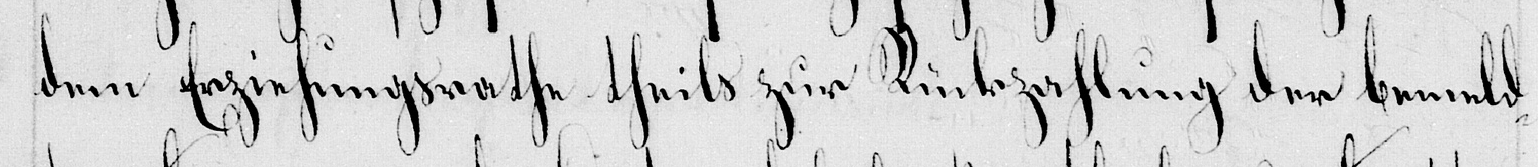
dem Erziehungsrathe theils zur Rückzahlung der bemeld¬
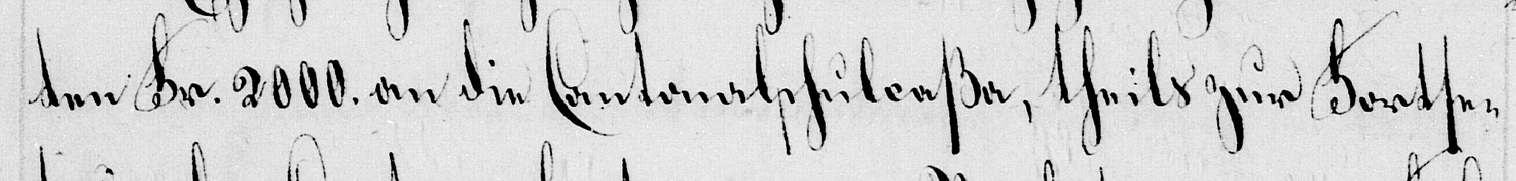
eten Fr. 2000. an die Cantonsschulcaßa, theils zur Fortse¬
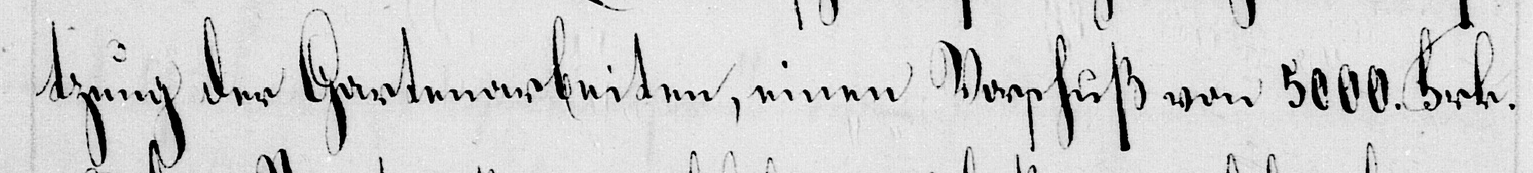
tzung der Gartenarbeiten, einen Vorschuß von 5000. Frk.
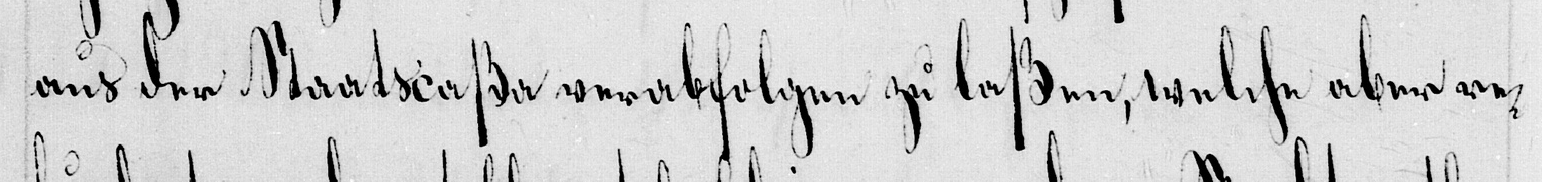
aus der Staatscaßa verabfolgen zu laßen, welche aber re¬
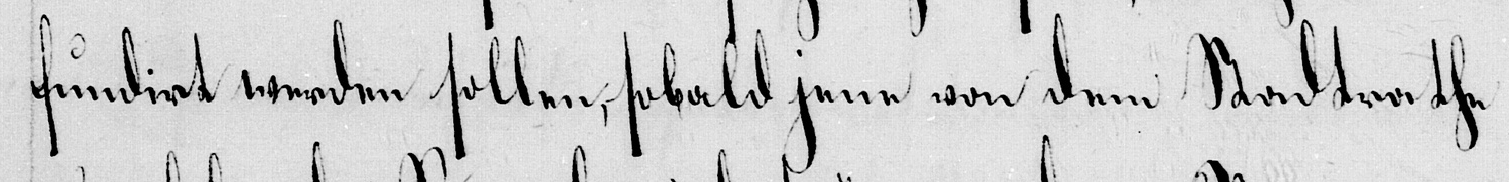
fundirt werden sollen, sobald jene von dem Stadtrathe
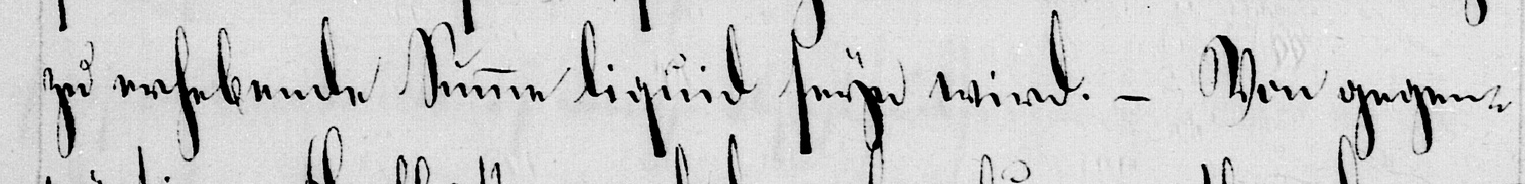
zu erhebende Summe liquid seyn wird. – Von gegen¬
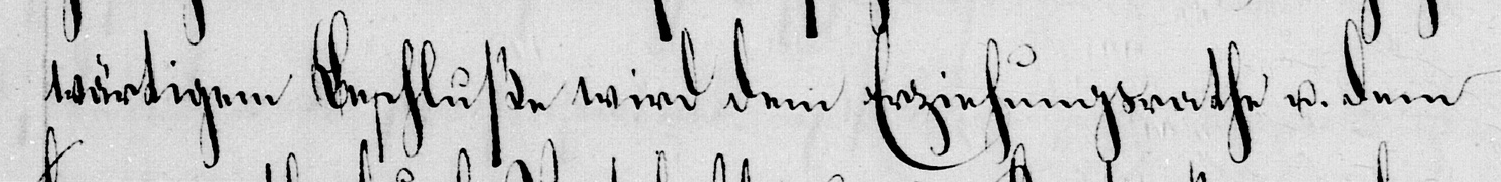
wärtigem Beschluße wird dem Erziehungsrathe u. dem
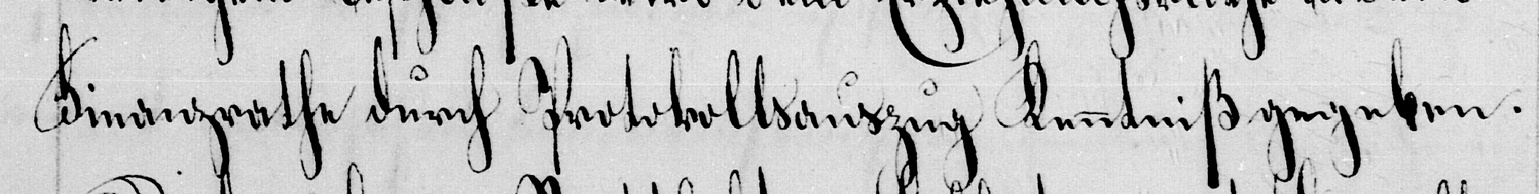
Finanzrathe durch Protokollsauszug Kenntniß gegeben.
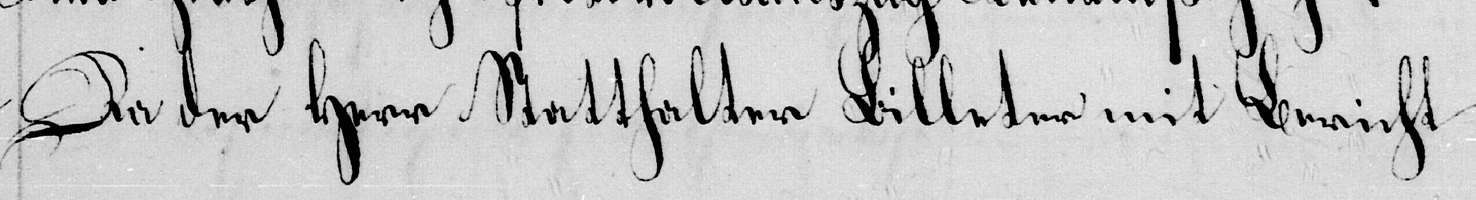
Da der Herr Statthalter Billeter mit Bericht
